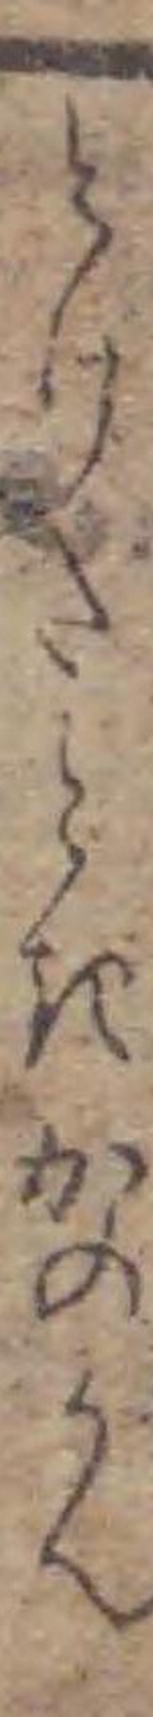とけたときかのかん
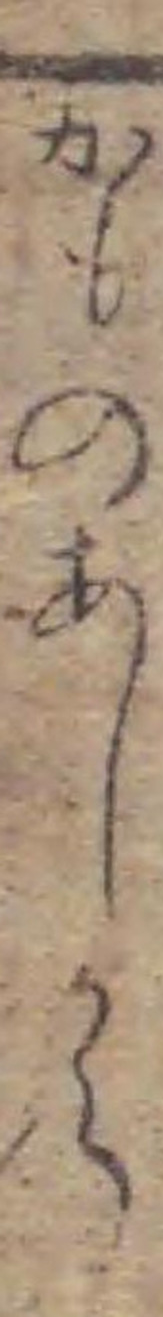かものあしから
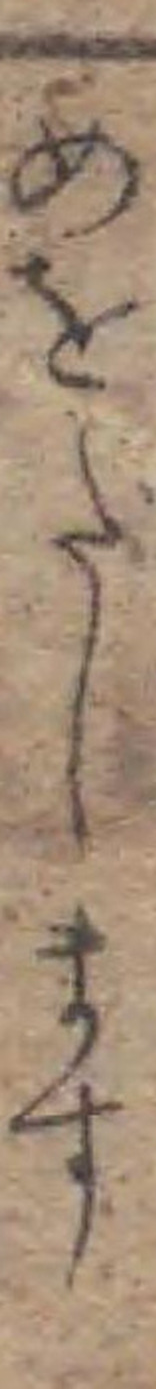めをだします
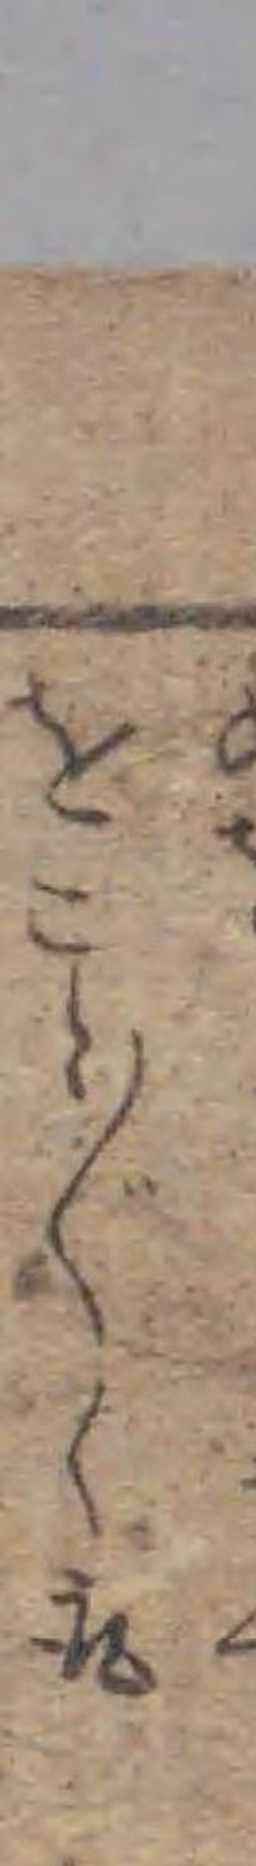をこと〴〵く取
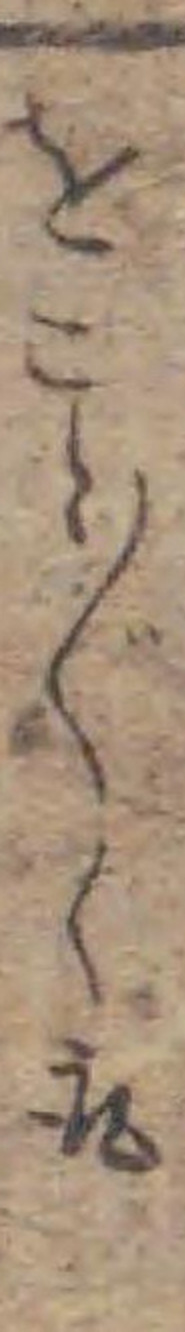をこと〴〵く取
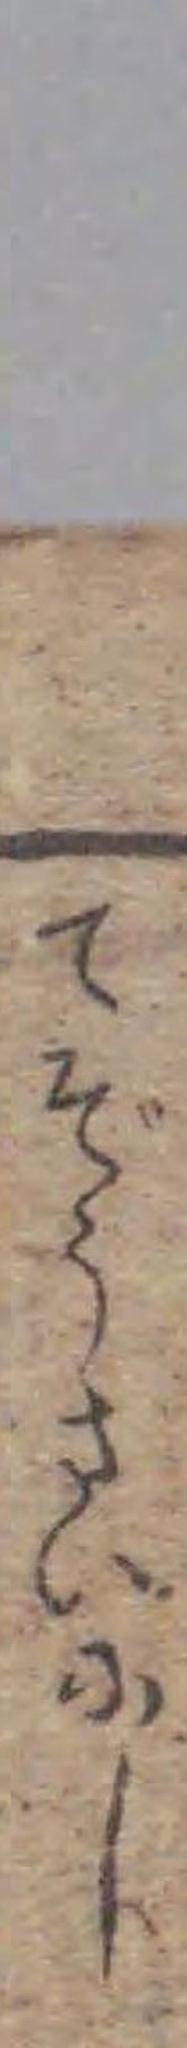てぞうさいにし
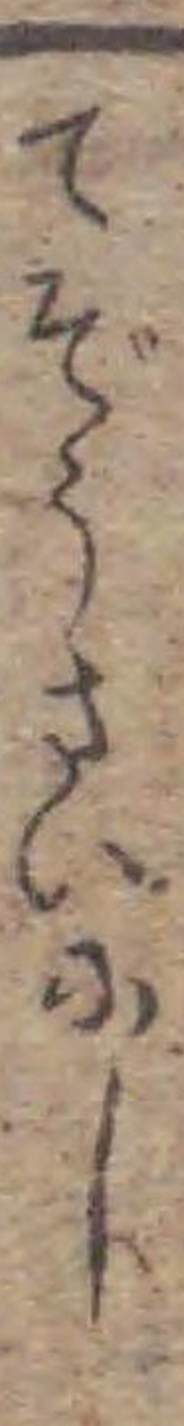てぞうさいにし
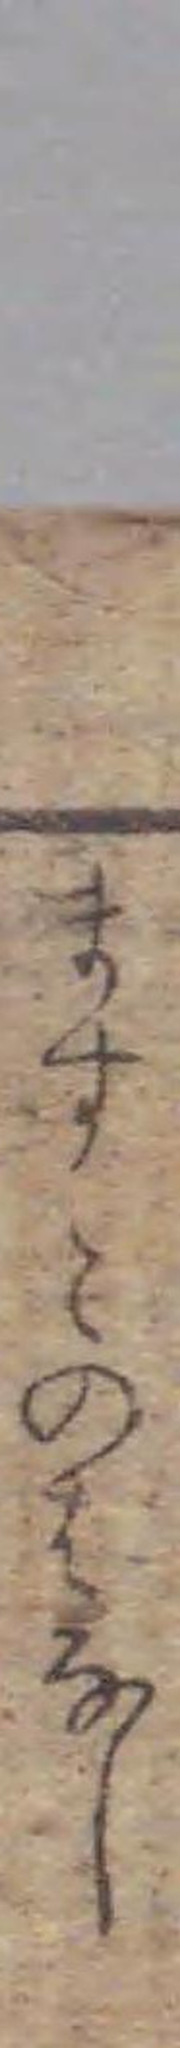ますこのはなし
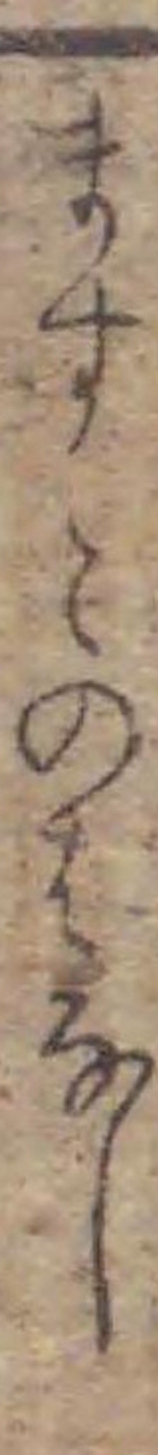ますこのはなし
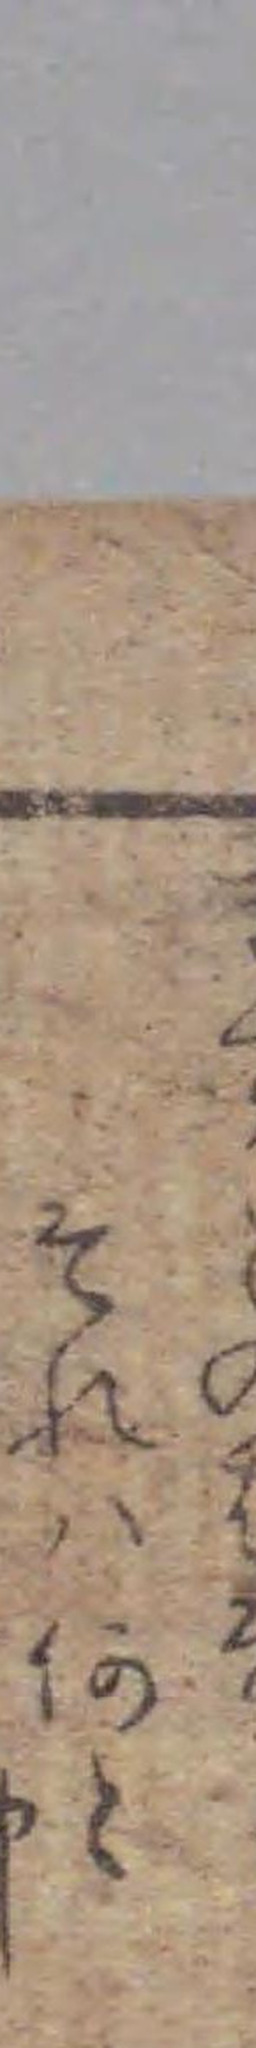それは何と
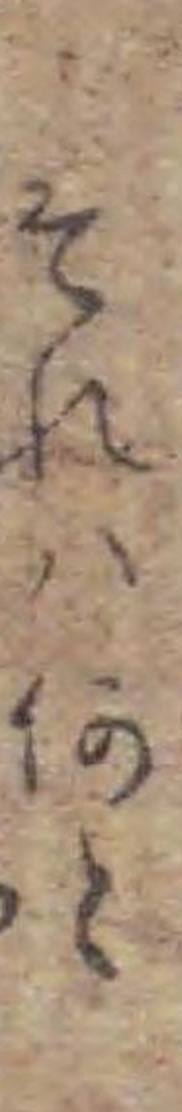それは何と
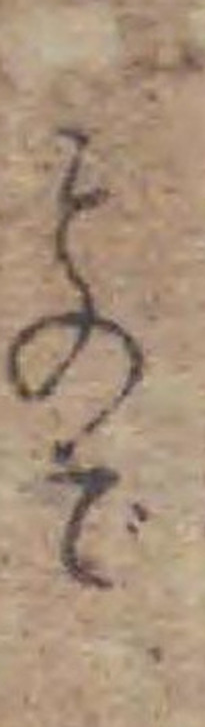もので
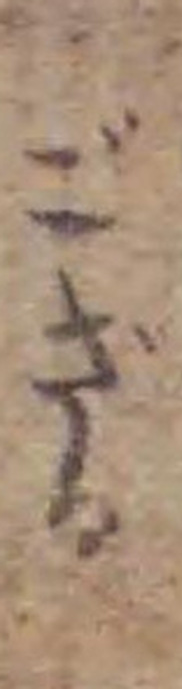ござる
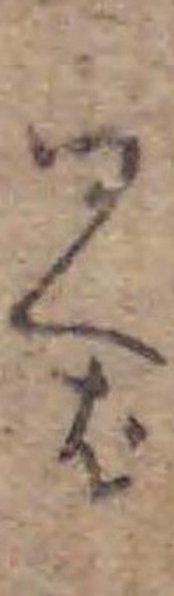問へば
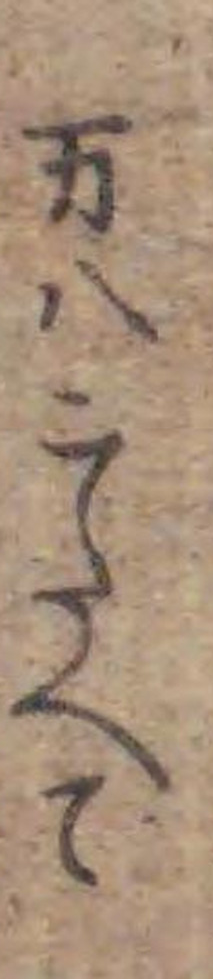万八こたへて
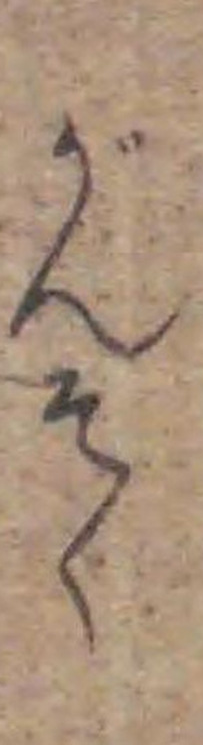がんそく
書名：虚言八百万八伝 : 3巻
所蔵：国立国会図書館 National Diet Library, JAPAN
